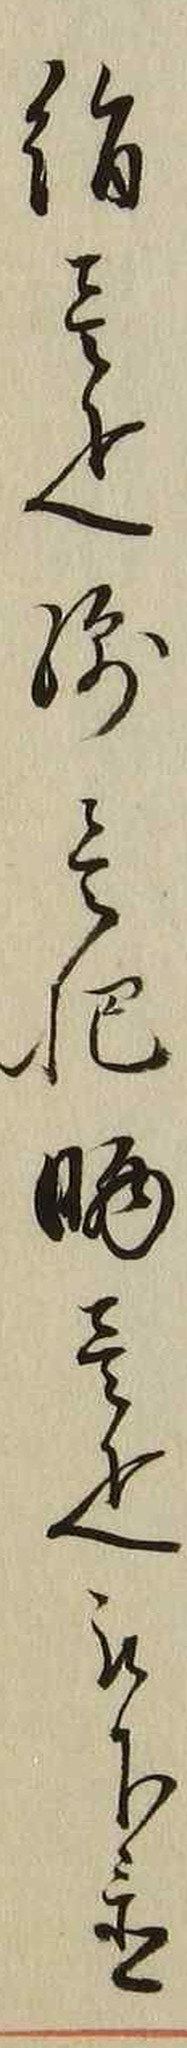絹壱疋綿壱肥晒壱疋被下置
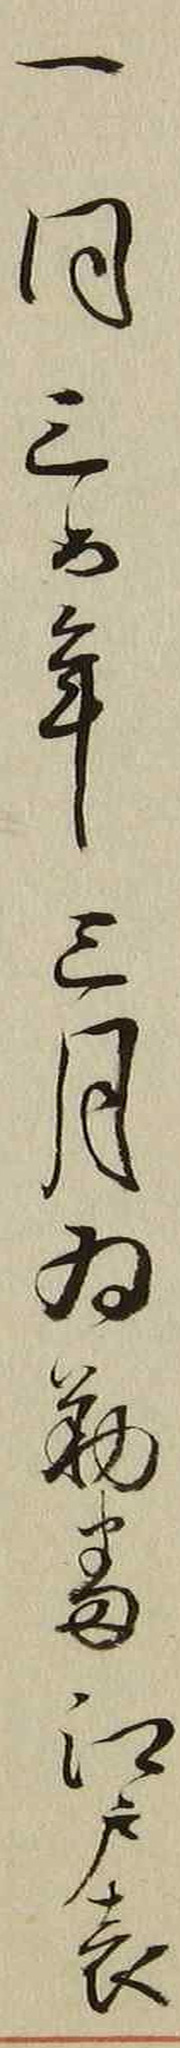一同三酉年三月為勤番江戸表
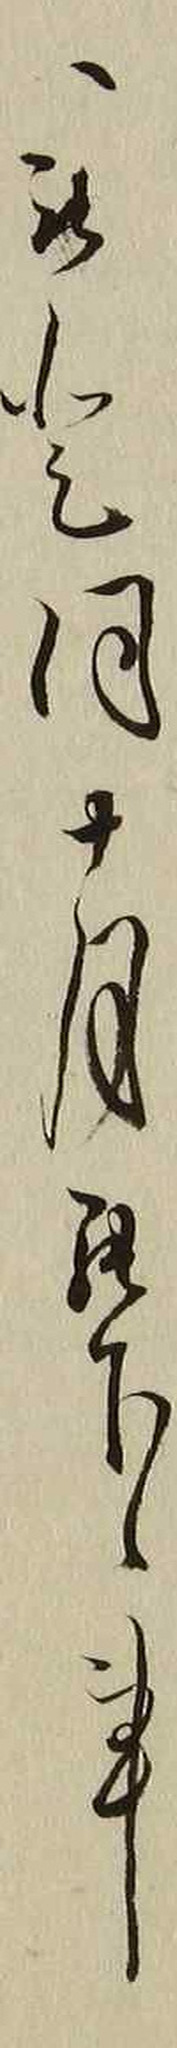へ罷登同十月罷下候事
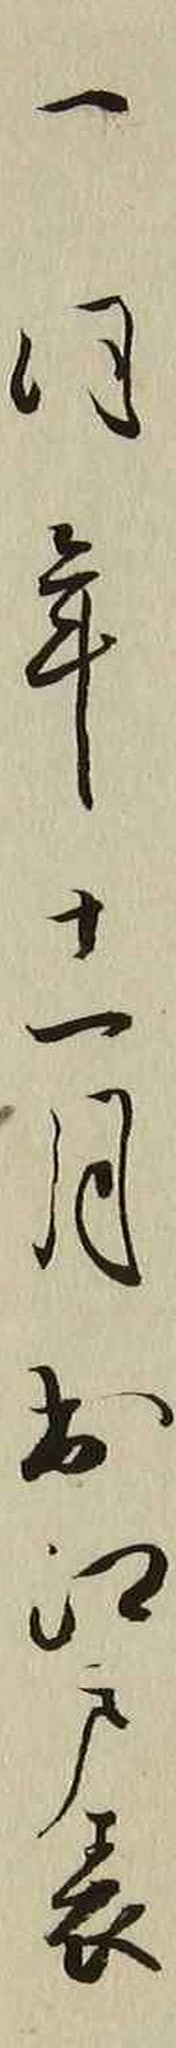一同年十一月於江戸表
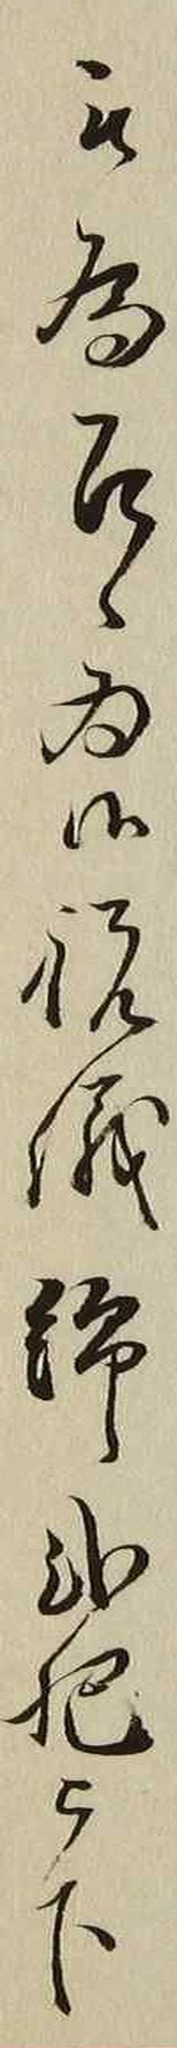被為召候為御祝儀綿弐把被下
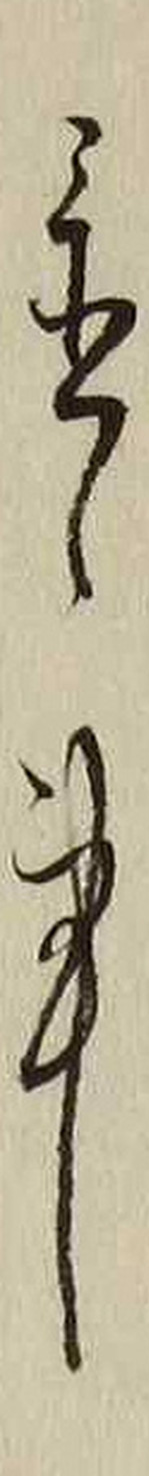置候事
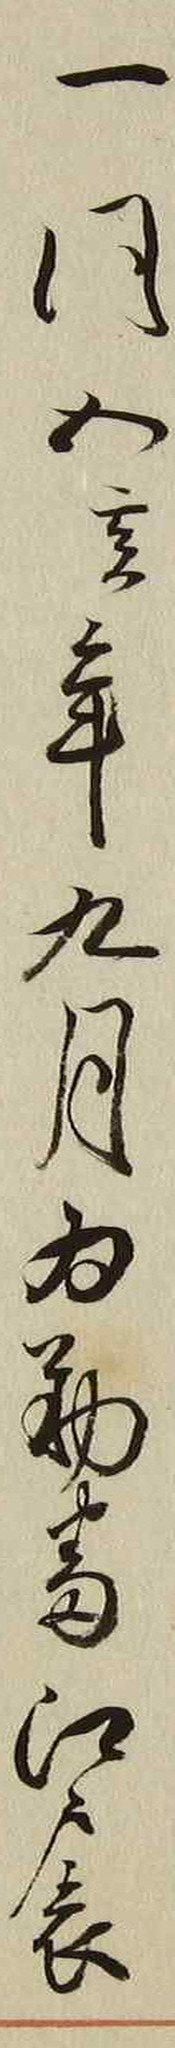一同五亥年九月為勤番江戸表
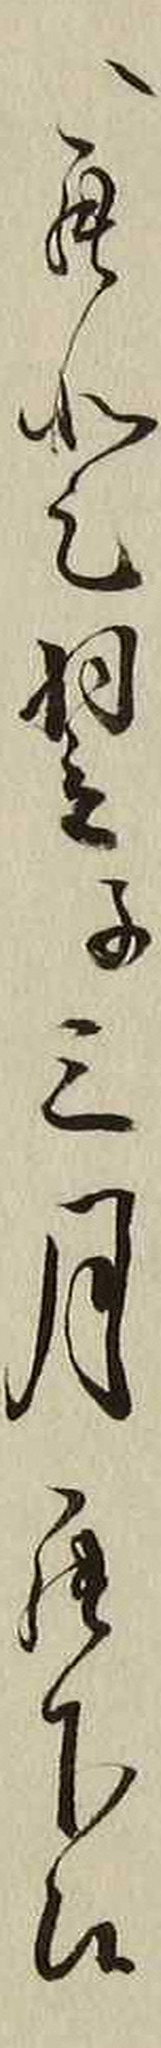へ罷登翌子三月罷下候
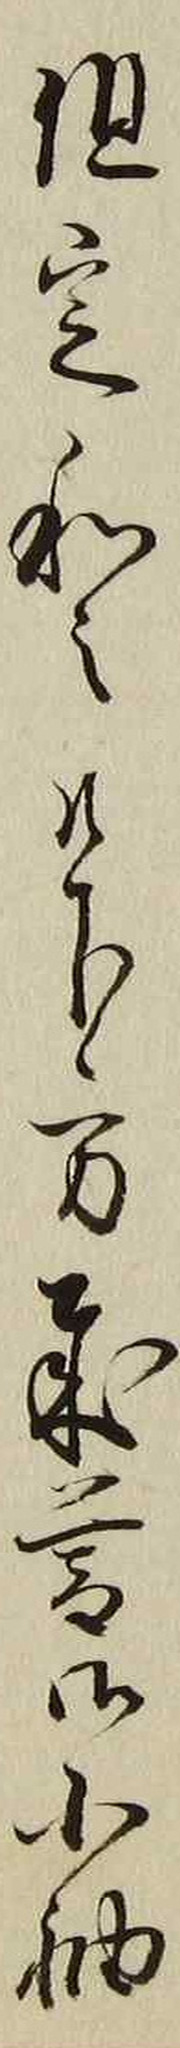但定和之被下方歳暮御小袖
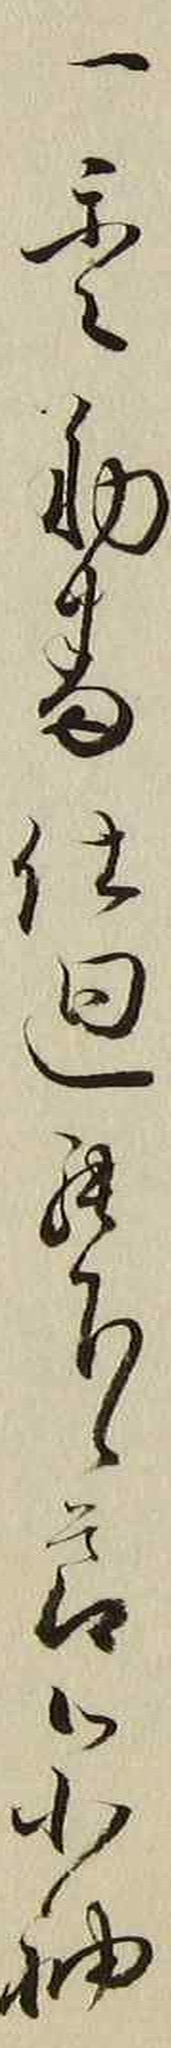一勤番仕廻罷下候節御小袖
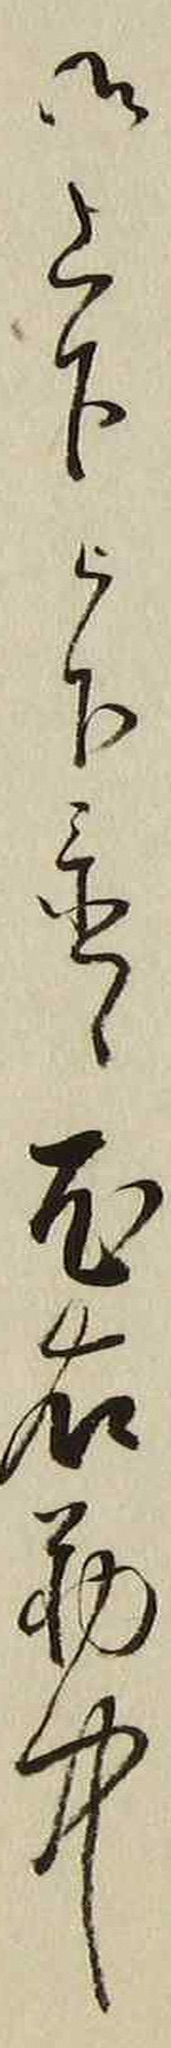御上下被下置候尤右勤中
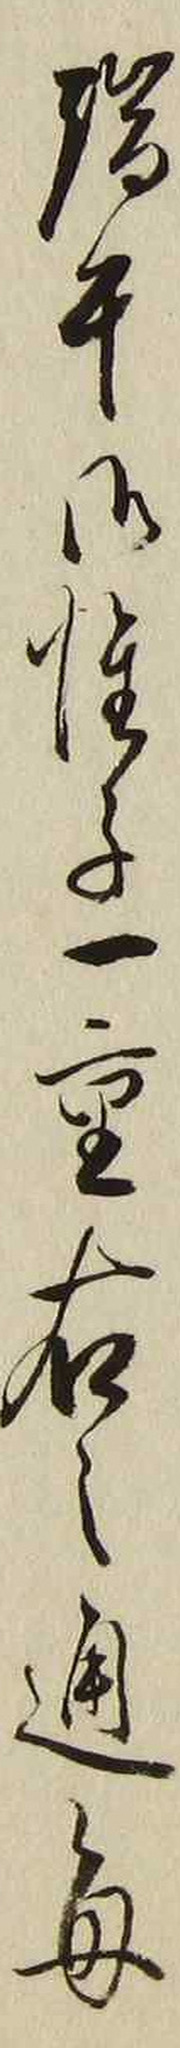端午御帷子一重右之通毎
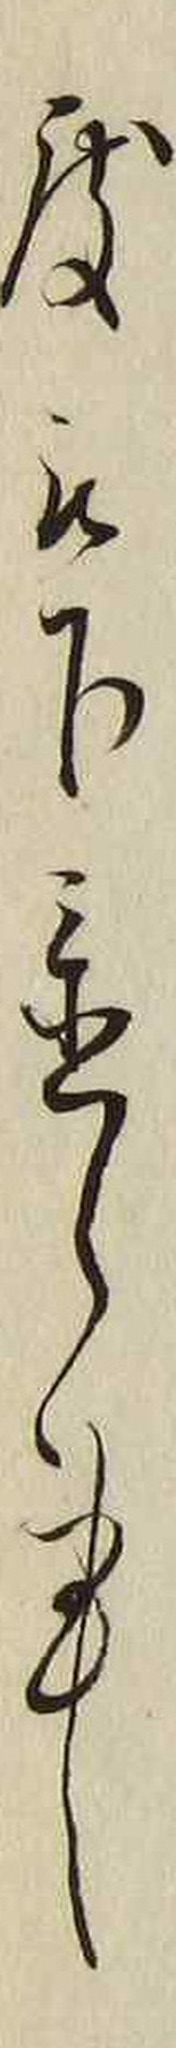度被下置候事

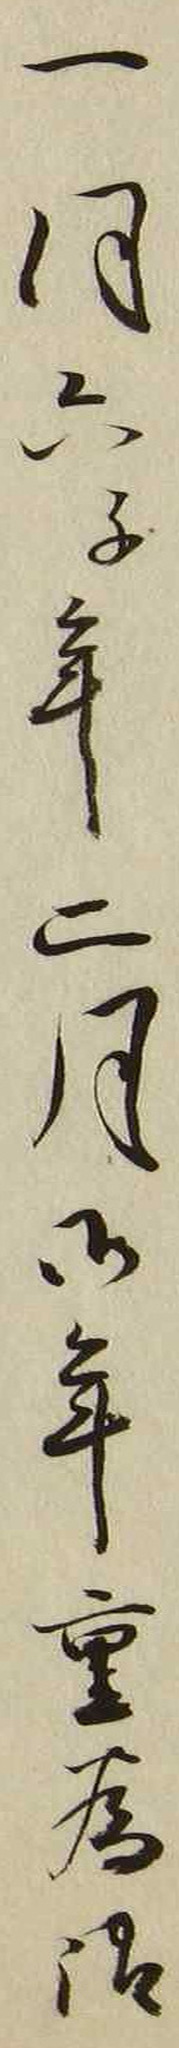一同六子年二月御年重為御
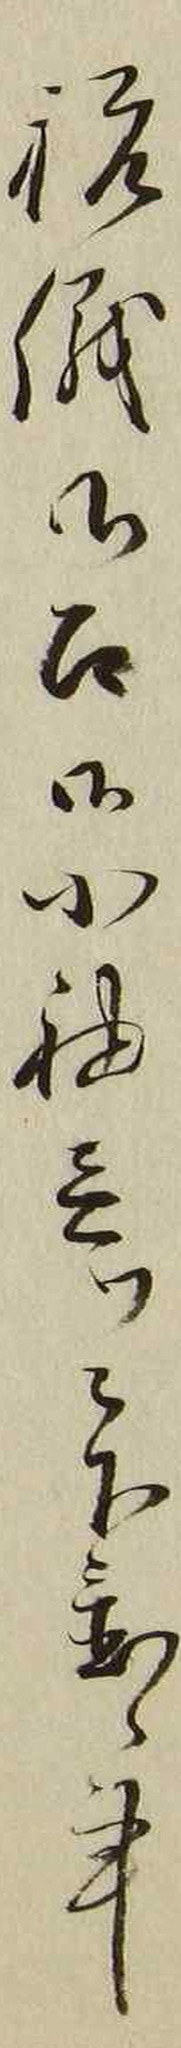祝儀御召御小袖壱ツ被下置候事
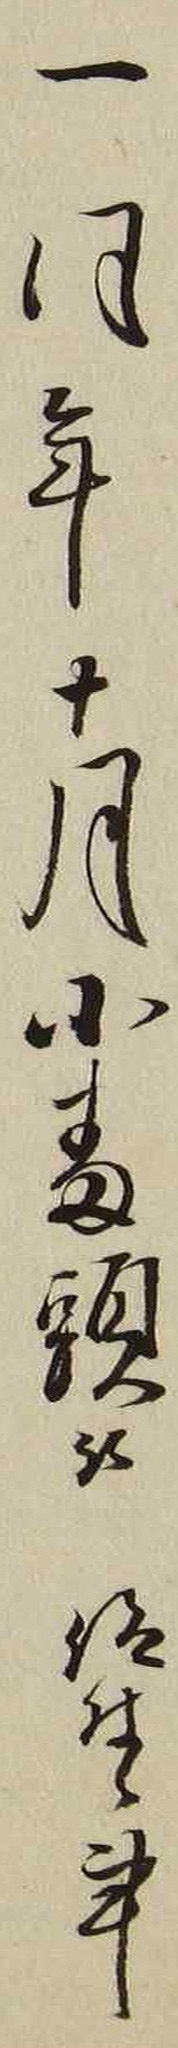一同年十月小番頭被仰付候事
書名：諸士系譜　巻之1　い之部1
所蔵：会津若松市立会津図書館
